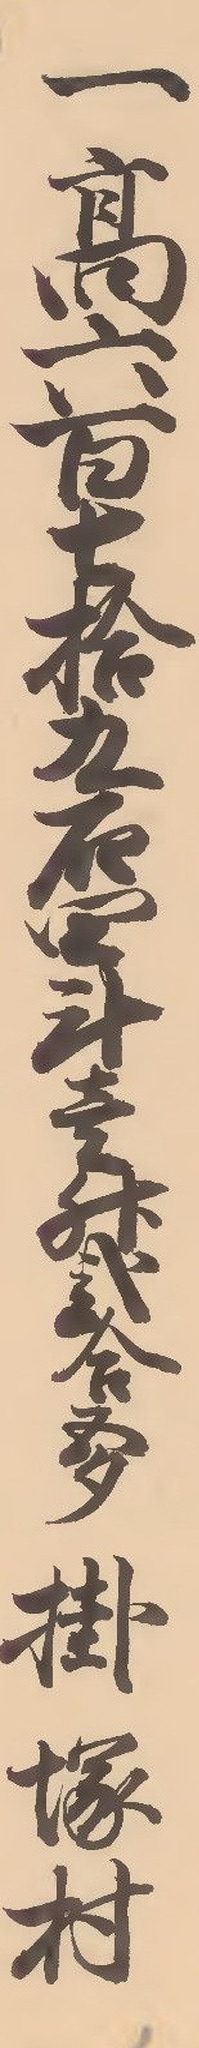一高六百七拾九石四斗壱升弐合五勺掛塚村
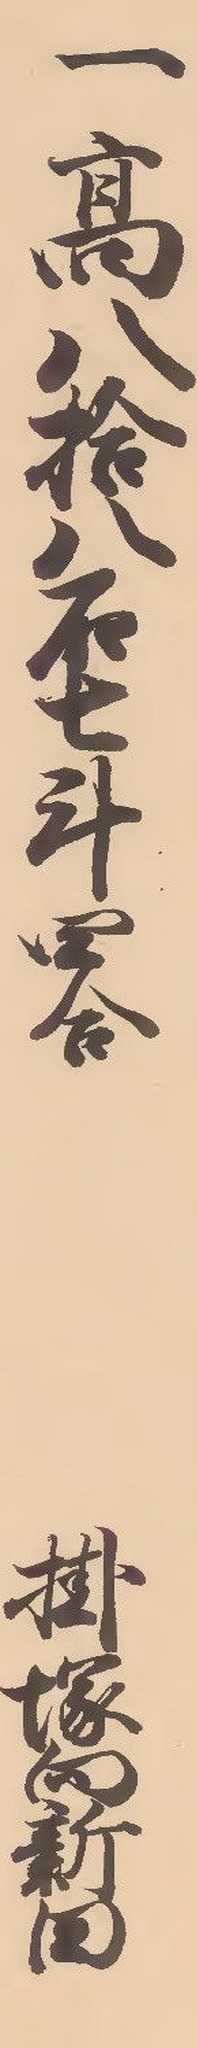一高八拾八石七斗四合掛塚向新田
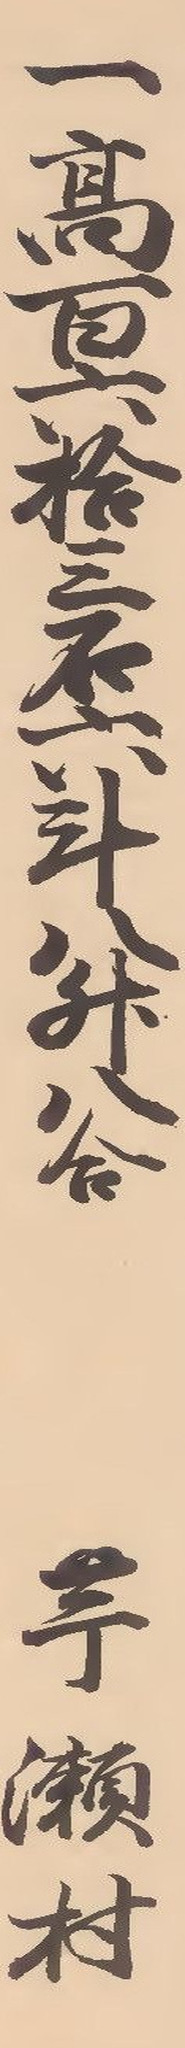一高百六拾三石六斗八升八合芋瀬村
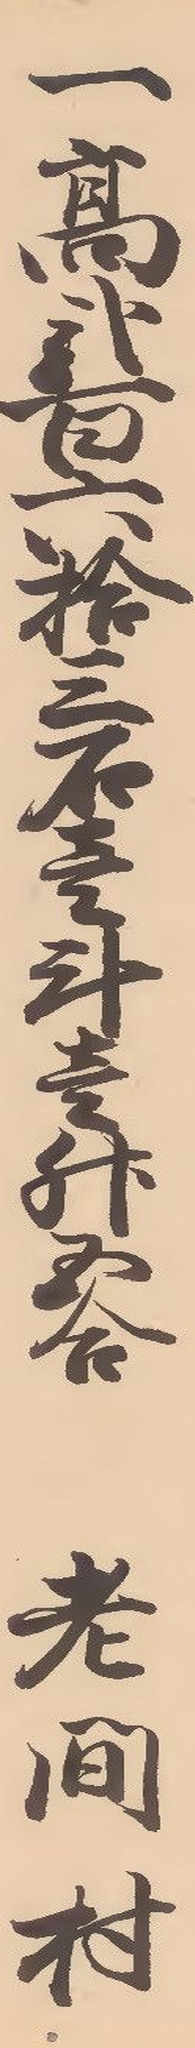一高弐百六拾三石壱斗壱升五合老間村
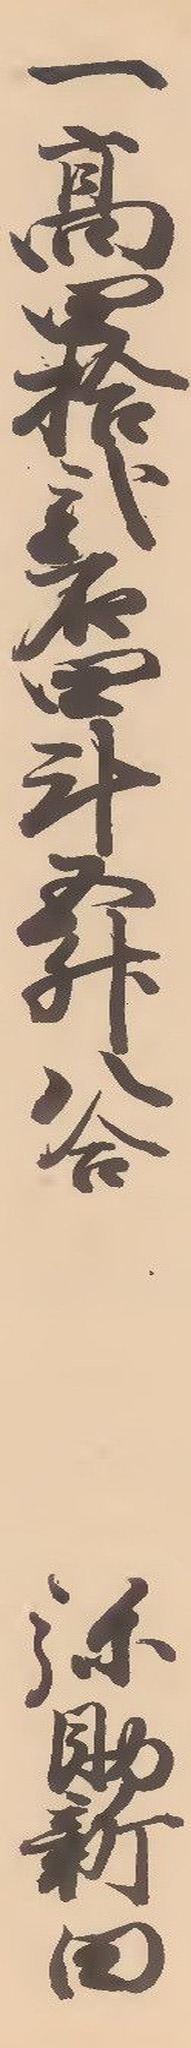一高四拾弐石四斗五升八合弥助新田
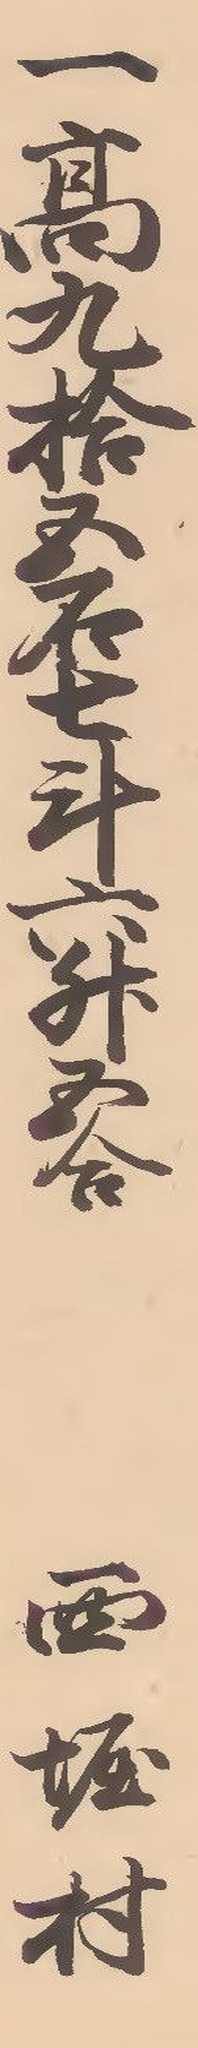一高九拾五石七斗六升五合西堀村

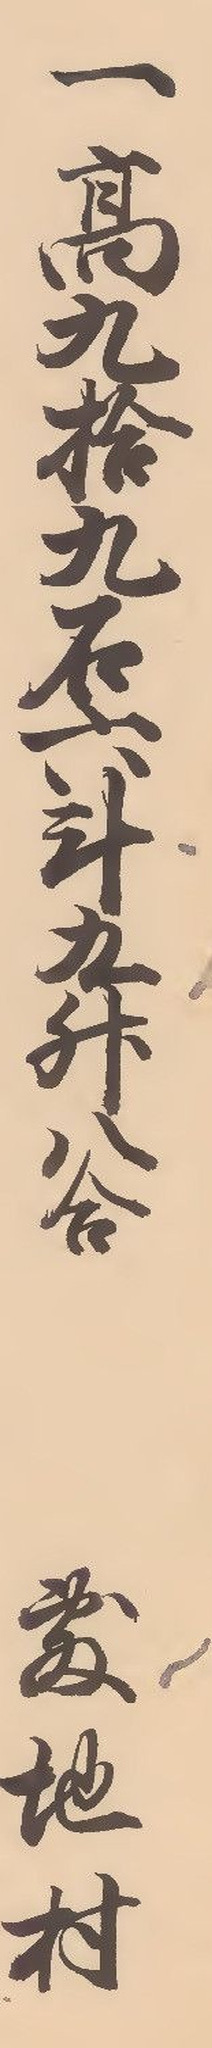一高九拾九石六斗九升八合敷地村
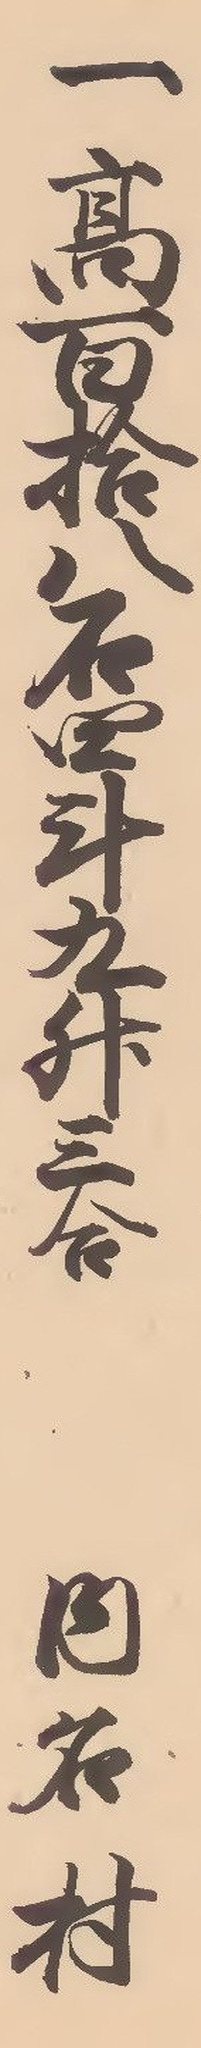一高百拾八石四斗九升三合内名村
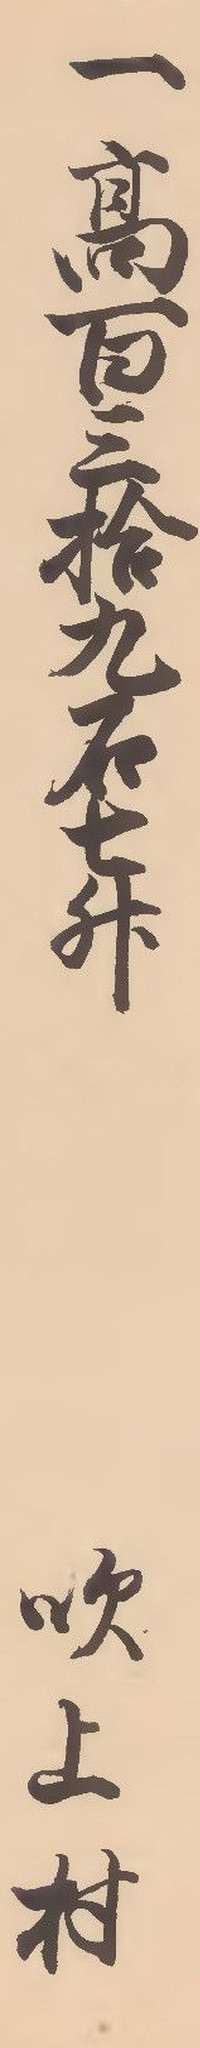一高百三拾九石七升吹上村
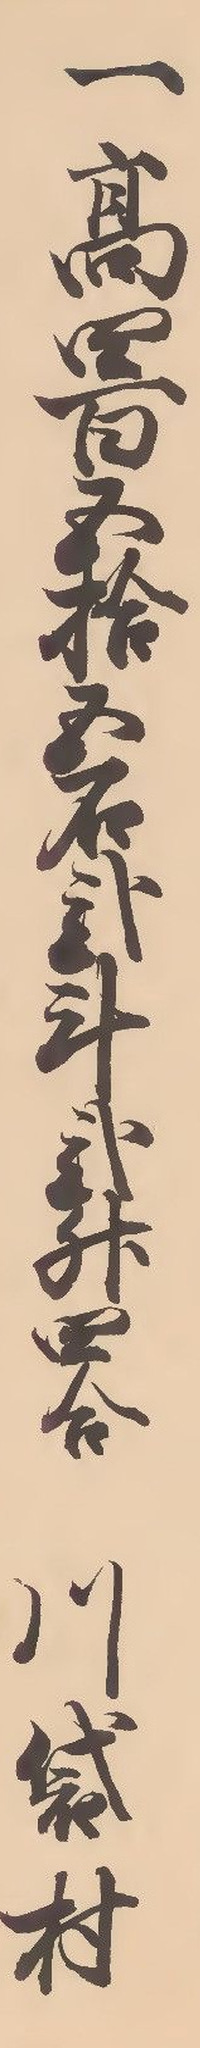一高四百五拾五石弐斗弐升四合川袋村
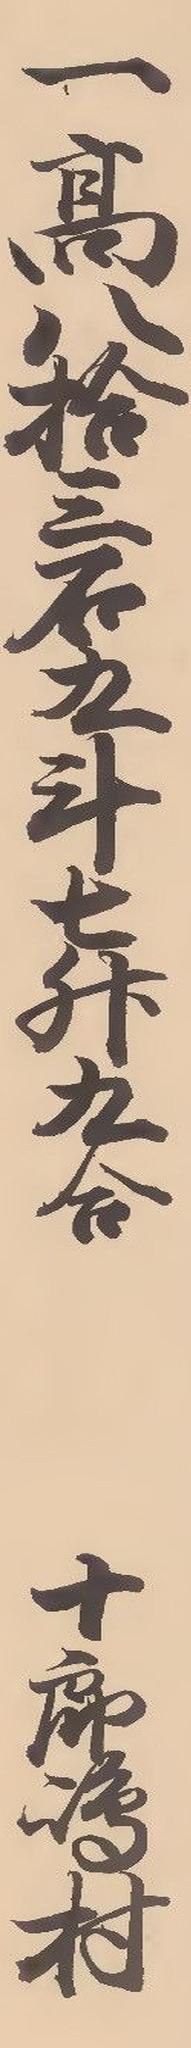一高八拾三石九斗七升九合十郎島村
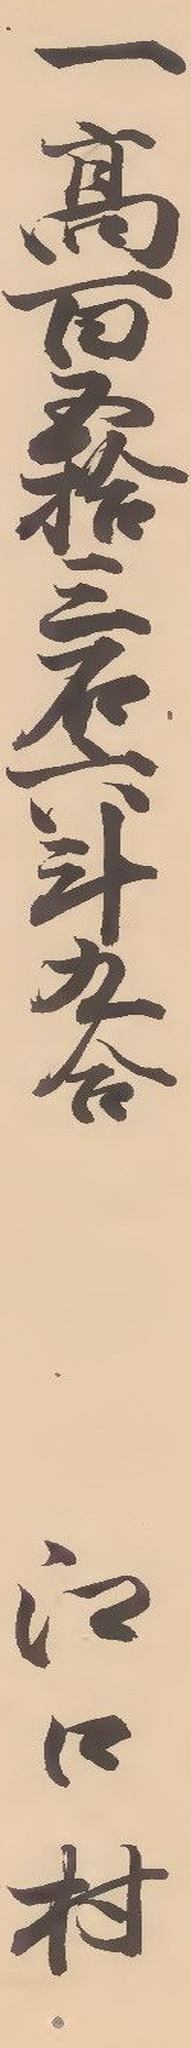一高百五拾三石六斗九合江口村
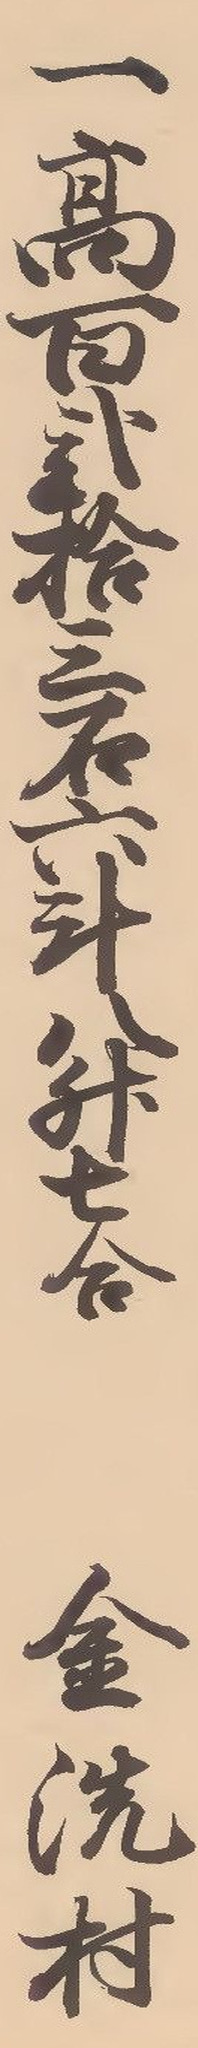一高百弐拾三石六斗八升七合金洗村
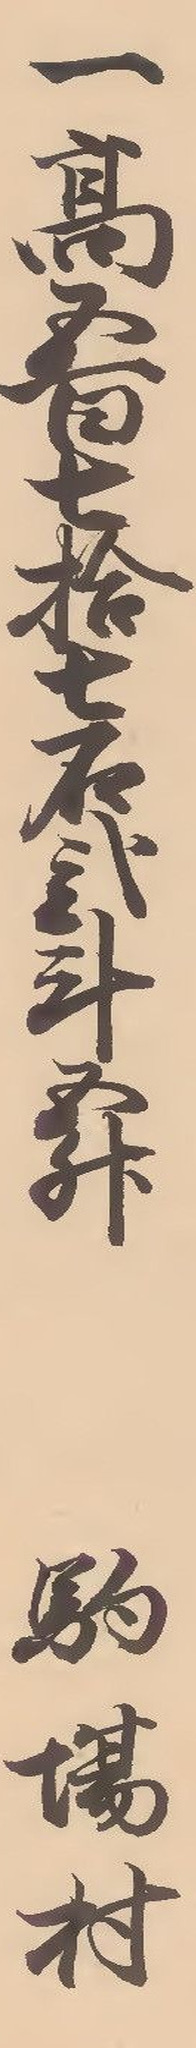一高五百七拾七石弐斗五升駒場村

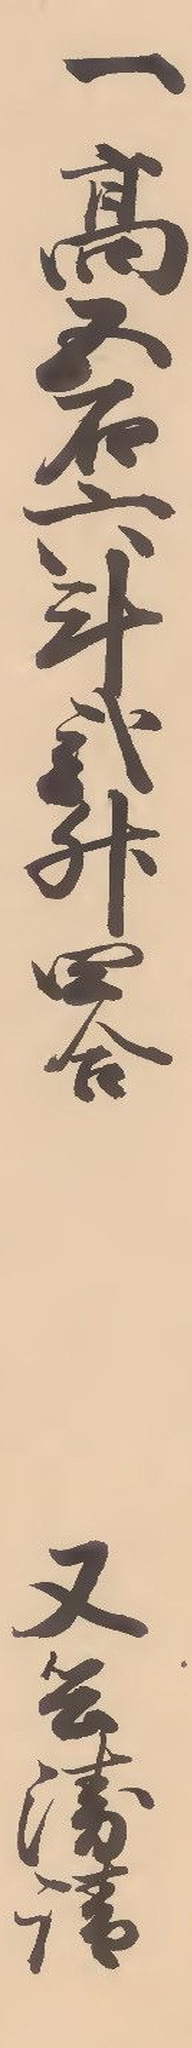一高五石六斗弐升四合又兵衛請
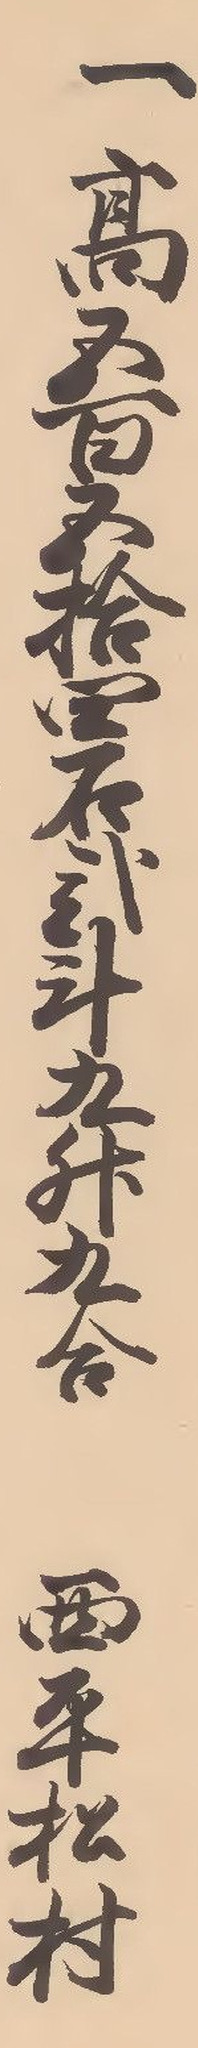一高五百五拾四石弐斗九升九合西平松村
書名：遠江国郷帳
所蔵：国立公文書館 National Archives of Japan
